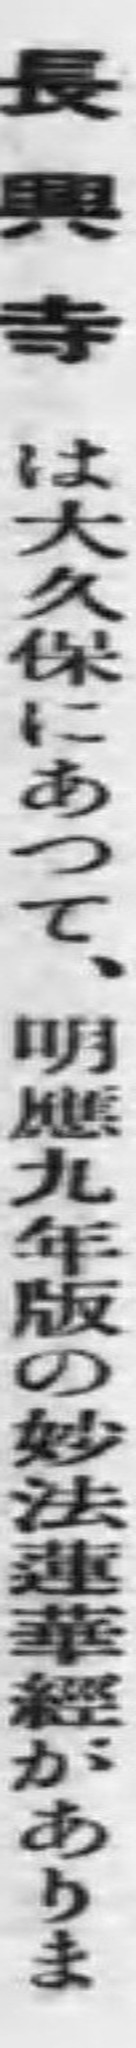長興寺は大久保にあつて、明応九年版の妙法蓮華経がありま
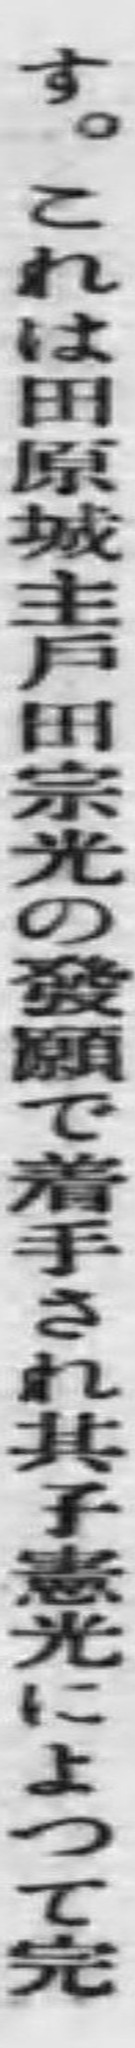す。これは田原城主戸田宗光の発願で着手され其子憲光によつて完
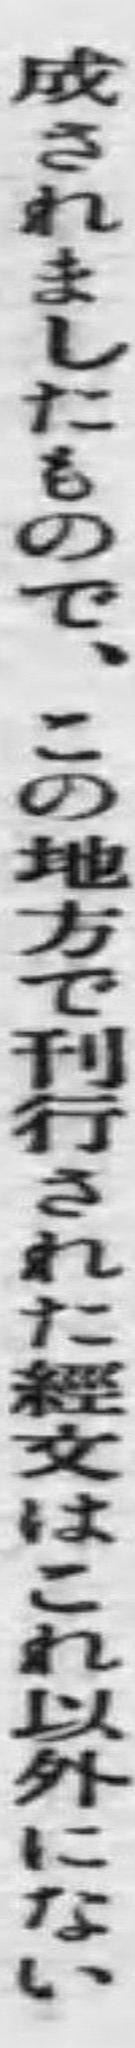成されましたもので、この地方で刊行された経文はこれ以外にない
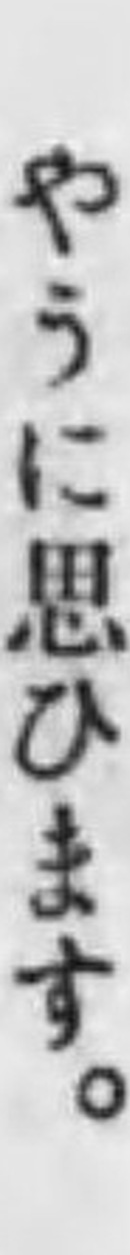やうに思ひます。
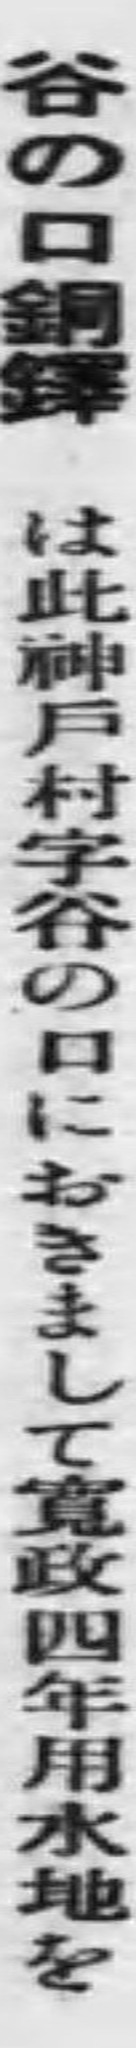谷の口銅鐸は此神戸村字谷の口におきまして寛政四年用水地を
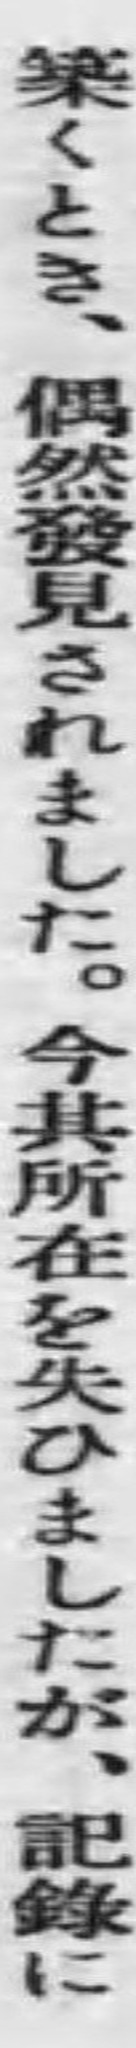築くとき、偶然発見されました。今其所在を失ひましたが、記録に
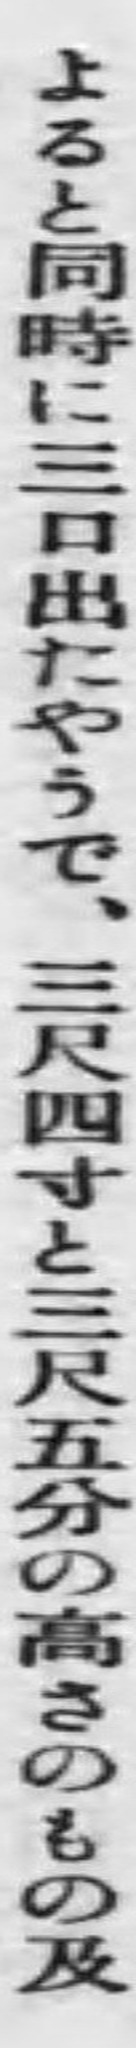よると同時に三口出たやうで、三尺四寸と三尺五分の高さのもの及
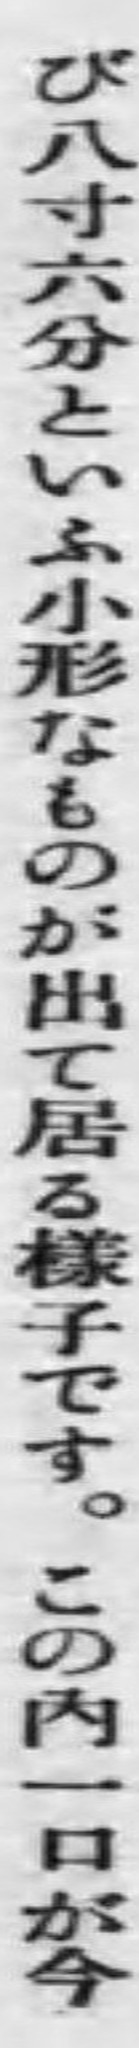び八寸六分といふ小形なものが出て居る様子です。この内一口が今
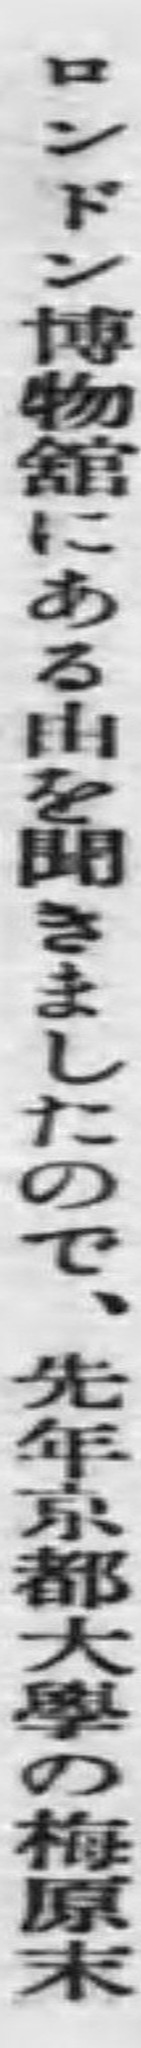ロンドン博物館にある由を聞きましたので、先年京都大学の梅原末
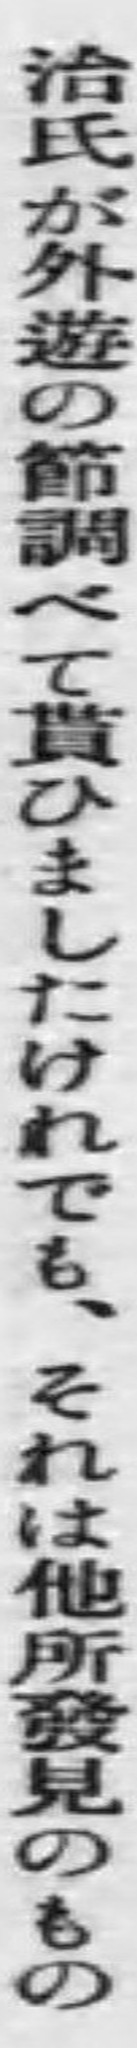治氏が外遊の節調べて貰ひましたけれでも、それは他所発見のもの
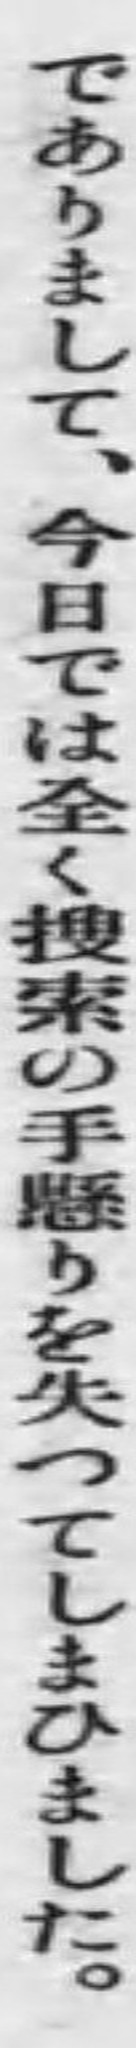でありまして、今日では全く捜索の手懸りを失つてしまひました。
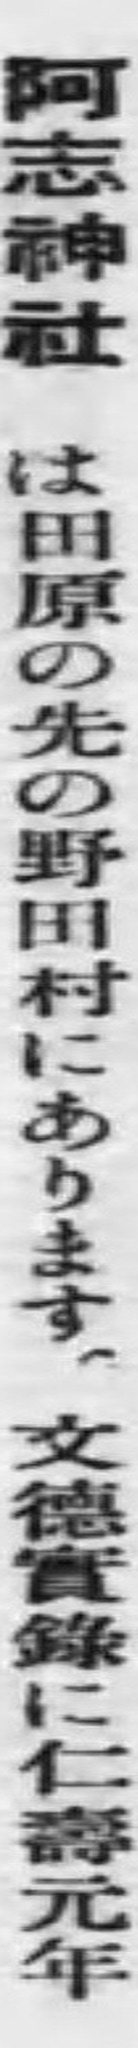阿志神社は田原の先の野田村にあります。文徳実録に仁寿元年
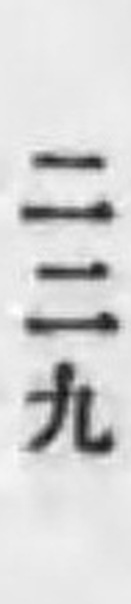二二九

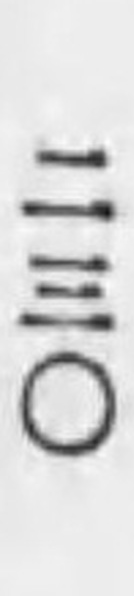二三〇
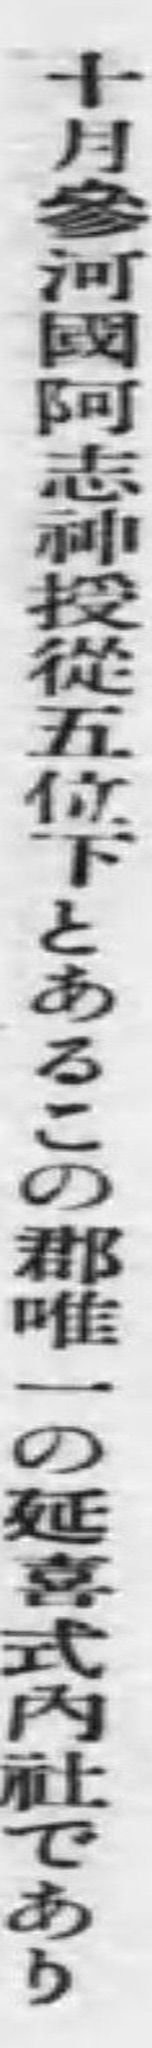十月参河国阿志神授従五位下とあるこの郡唯一の延喜式内社であり
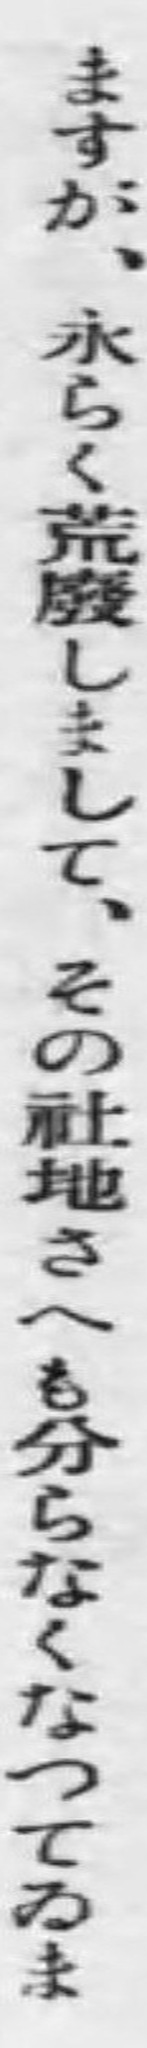ますが、永らく荒廃しまして、その社地さへも分らなくなつてゐま
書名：東三河道中記 : 豊橋市及其附近案内
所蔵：国立国会図書館 National Diet Library, JAPAN
